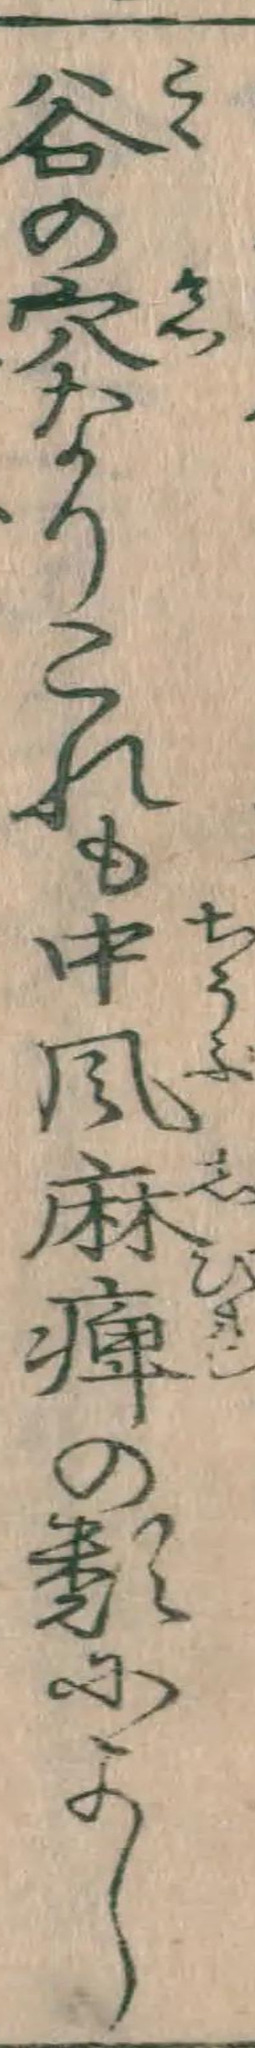谷の穴なりこれも中風麻痺の類によし
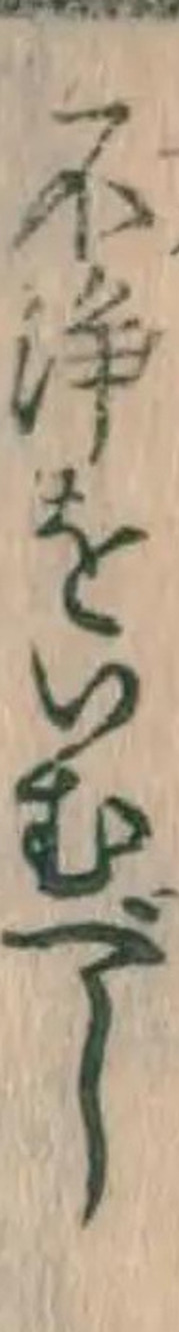不浄をいむべし
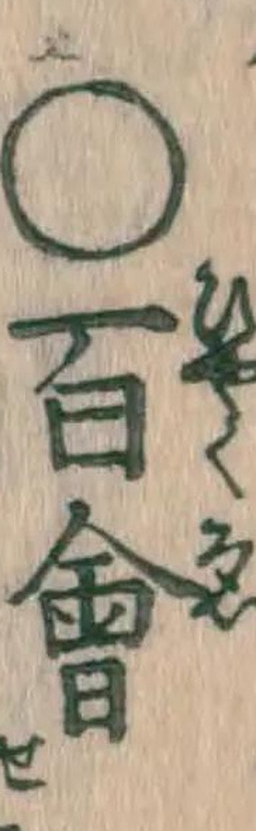○百会
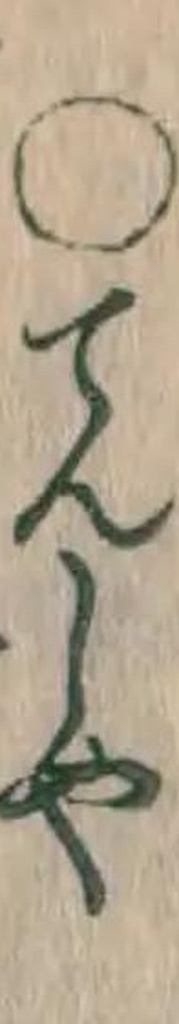○てんしや
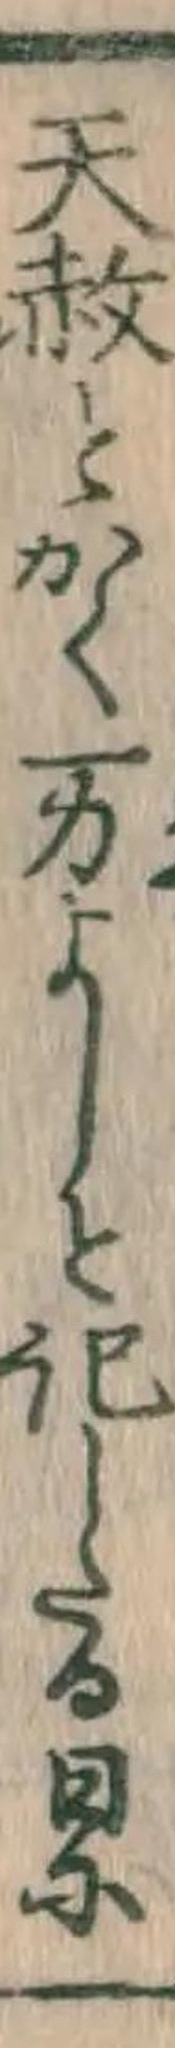天赦とかく万よしと記したる日に
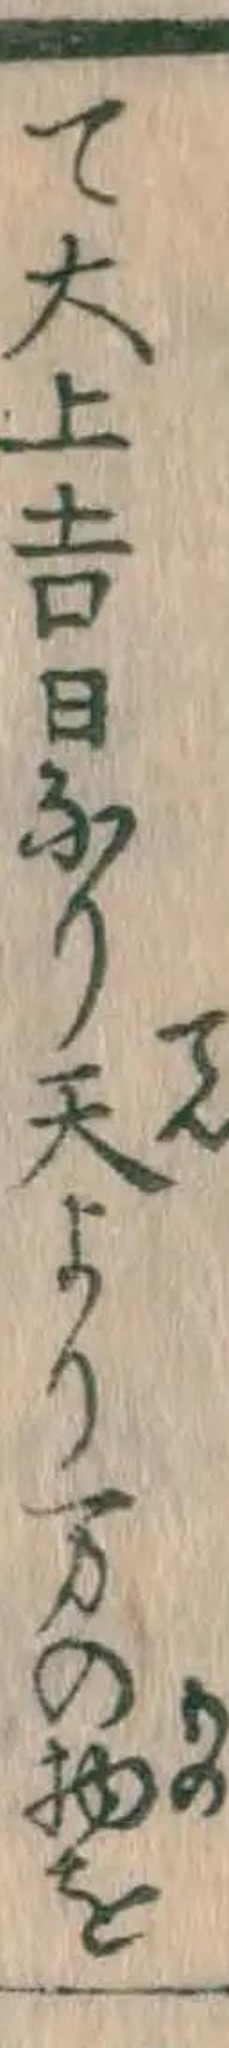て大上吉日なり天より万の物を
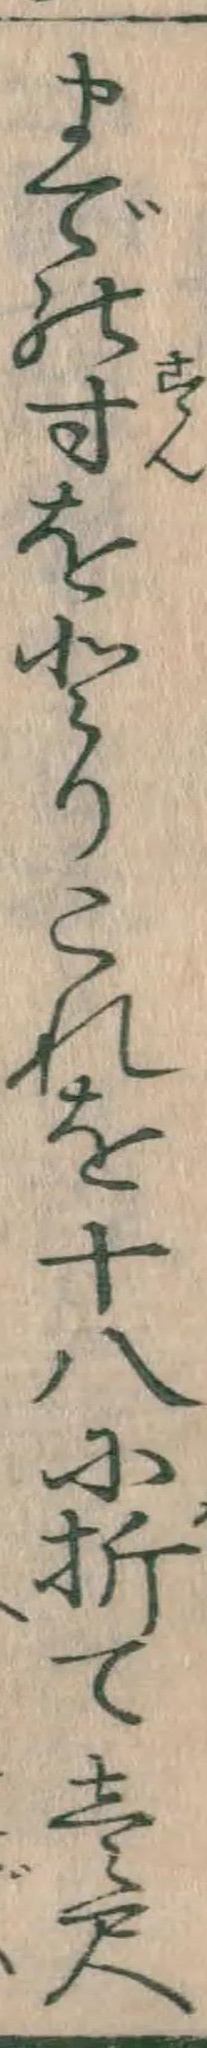までの寸をとりこれを十八に折て壱尺
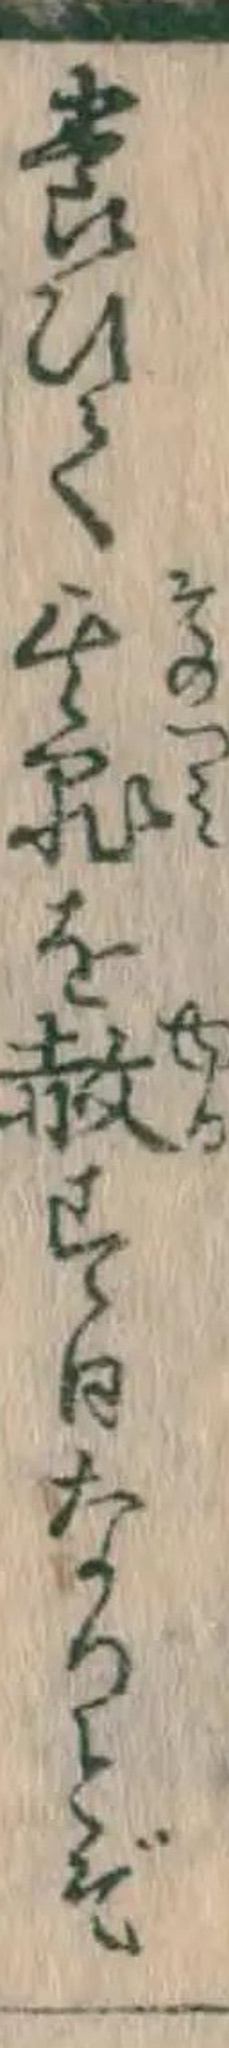養ひて其罪を赦す日なりとぞ
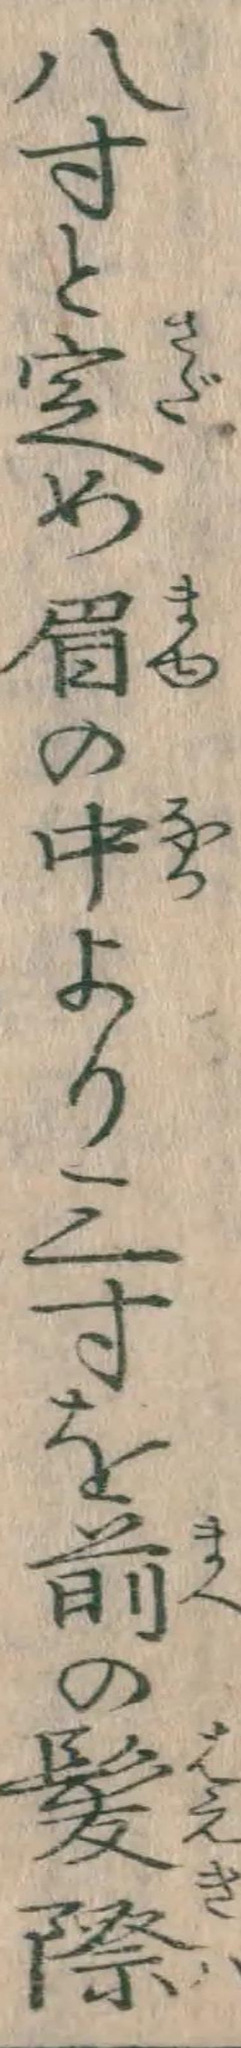八寸と定め眉の中より三寸を前の髪際
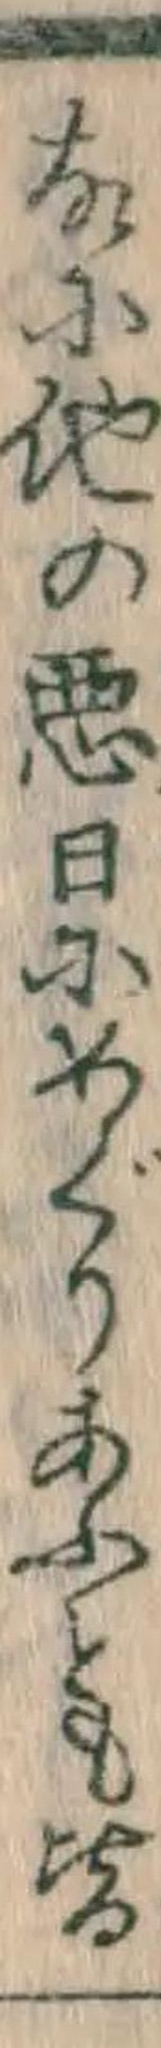故に他の悪日にめぐりあふとも皆
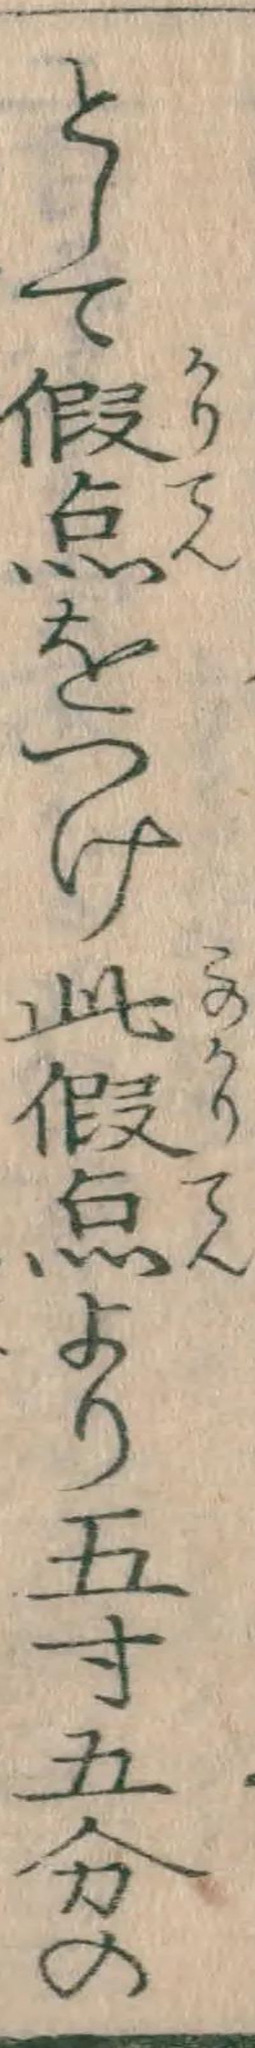として仮点をつけ此仮点より五寸五分の
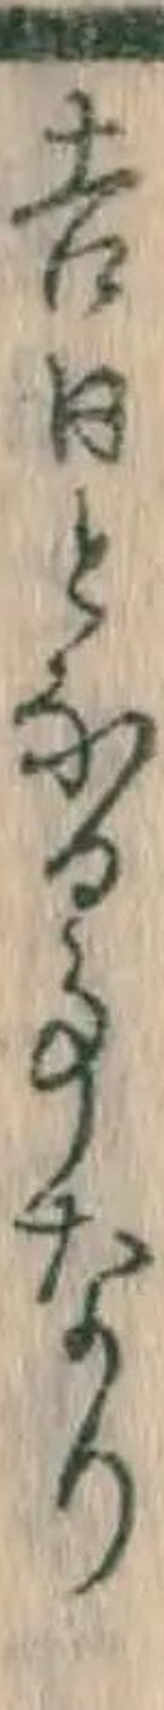吉日となる事なり
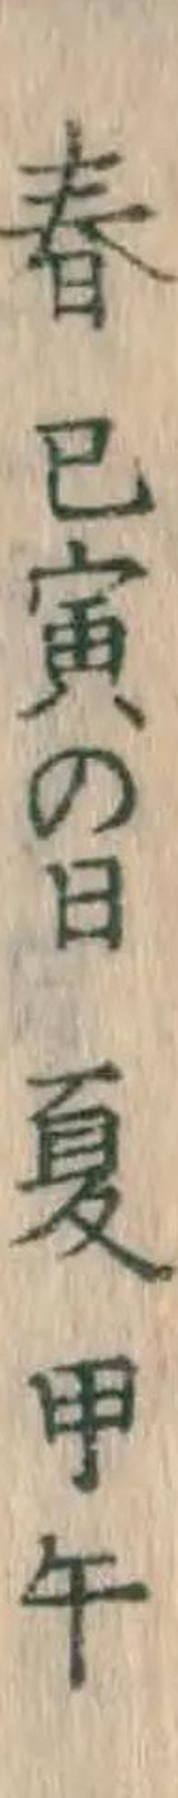春巳寅の日夏甲午
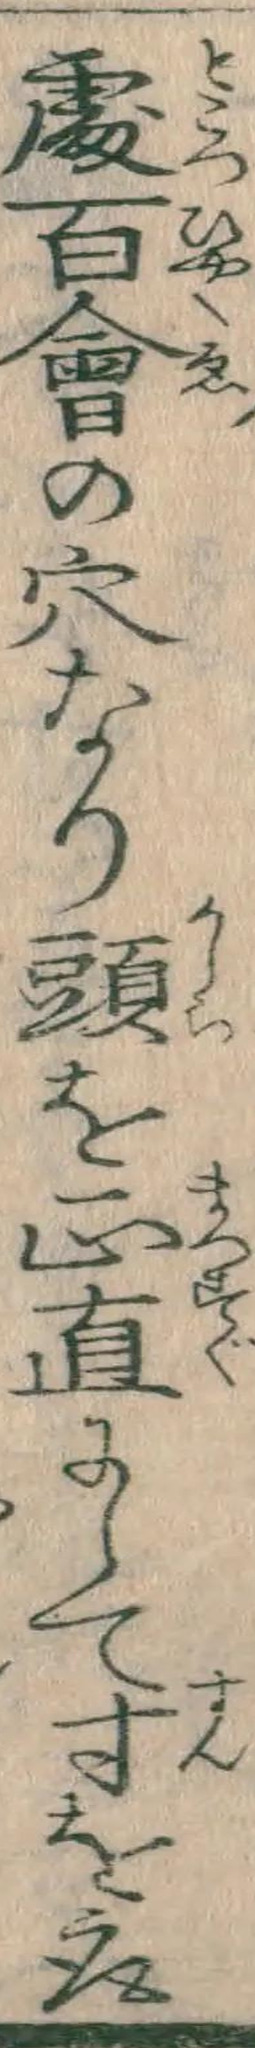処百会の穴なり頭を正直にして寸を取
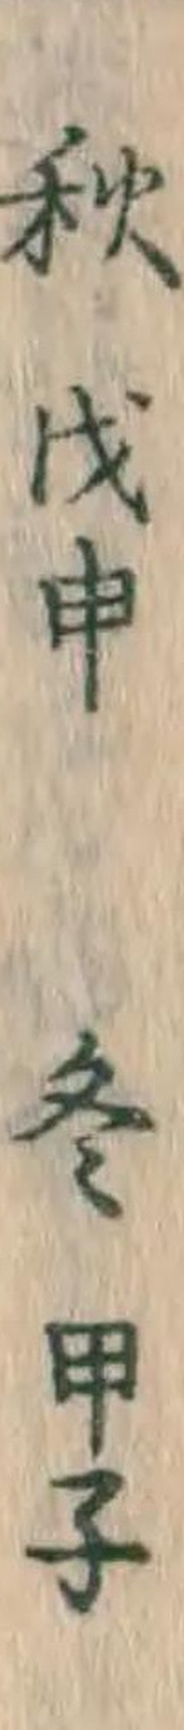秋戊申冬甲子
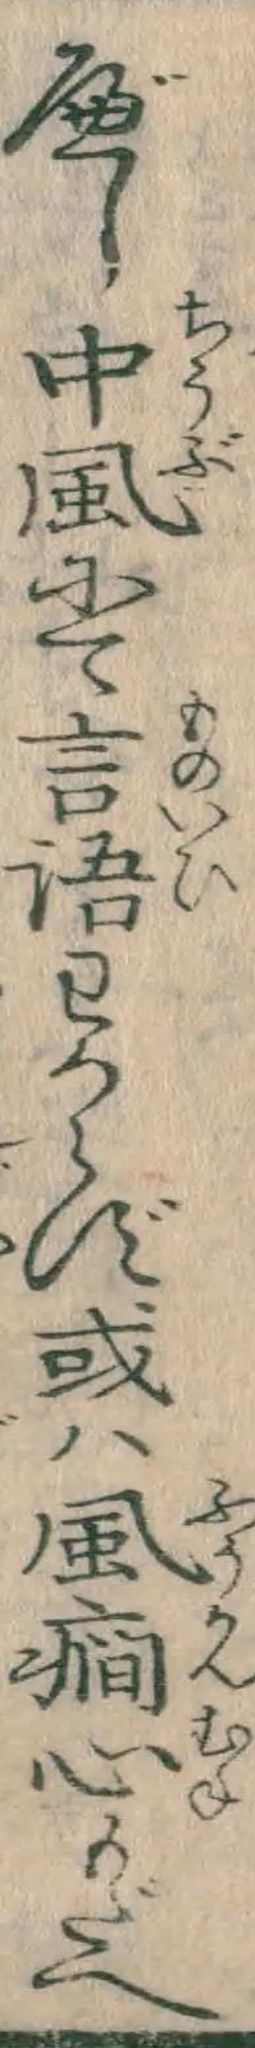べし中風にて言語わからず或は風癇心もだへ
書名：広益秘事大全 3巻. [4]
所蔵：国立国会図書館 National Diet Library, JAPAN
